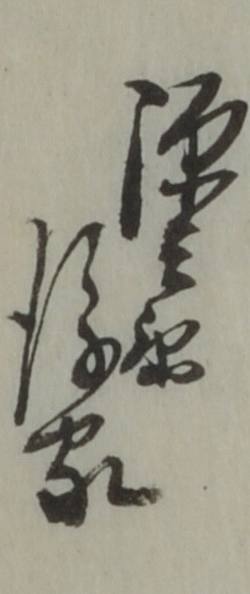源兵衛
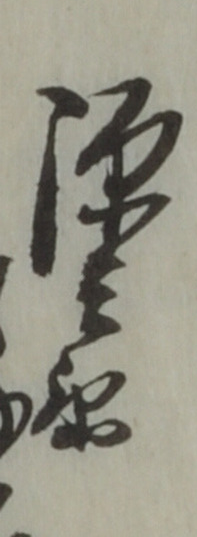源兵衛
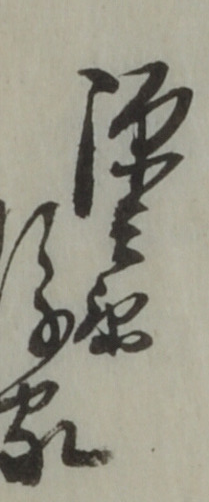源兵衛
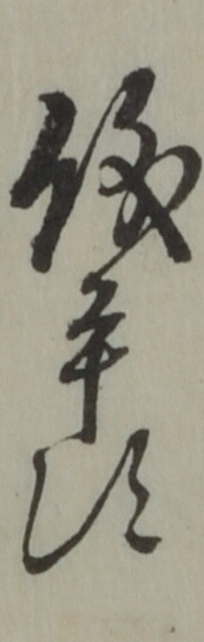儀平治
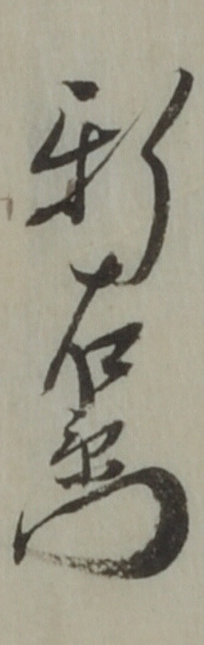新右衛門
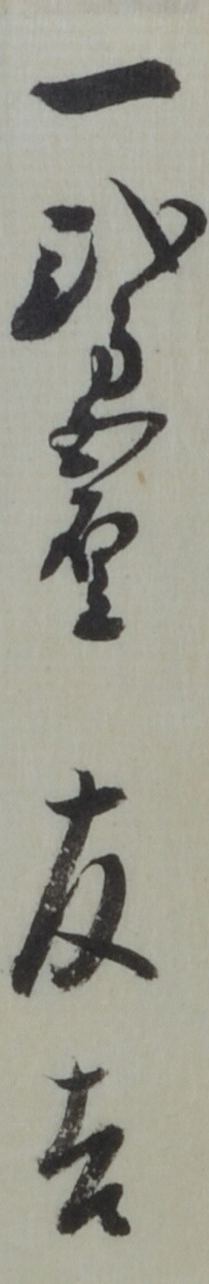一弐分五厘友吉
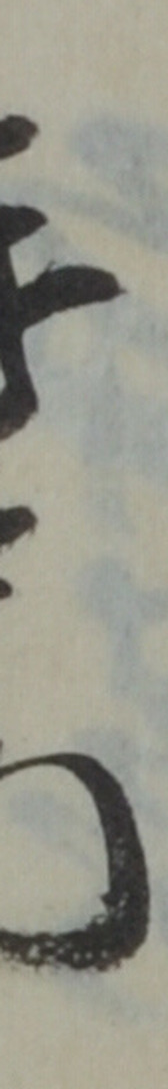新右衛門

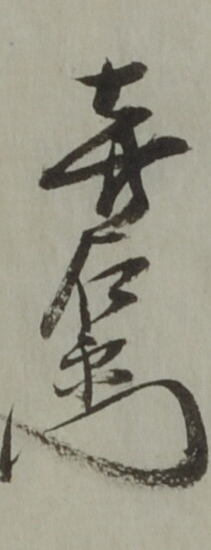喜右衛門
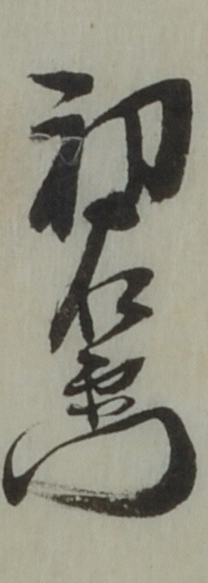初右衛門
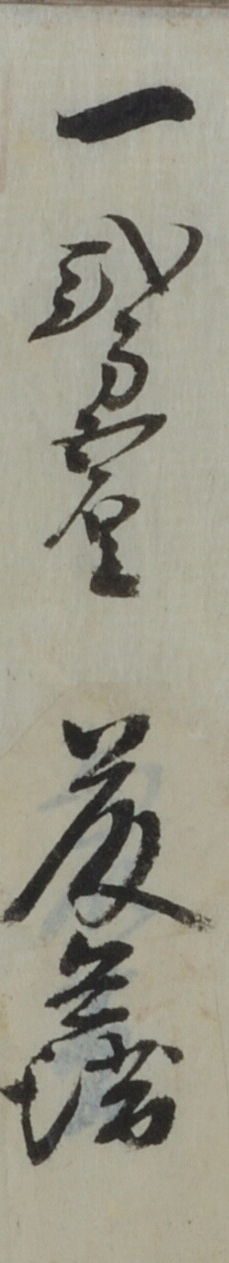一弐分五厘藤兵衛
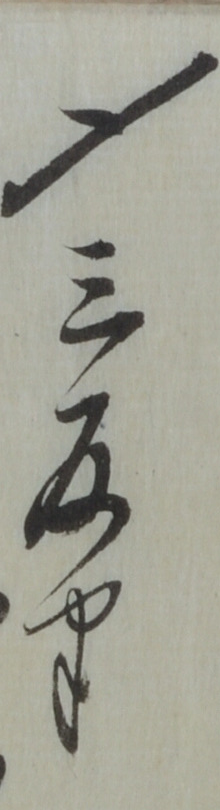〆三反半
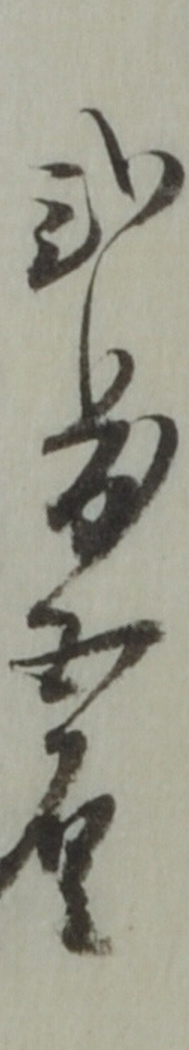弐歩五厘
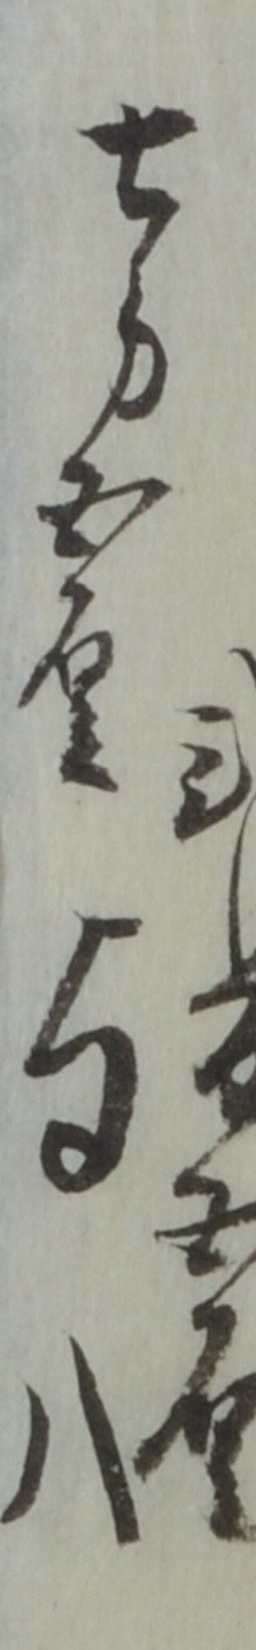一七分五厘与八

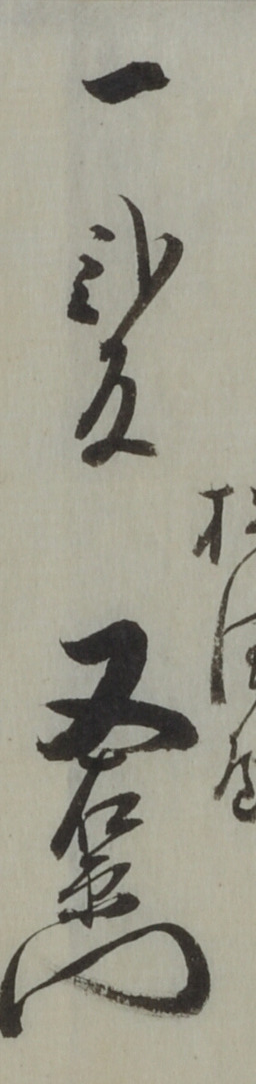一弐反又右衛門
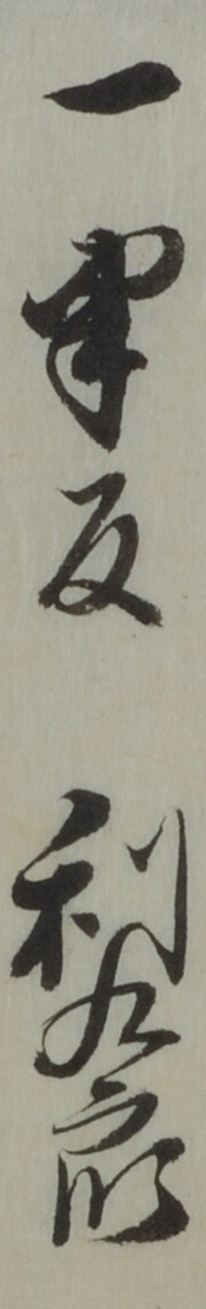一半反利九郎
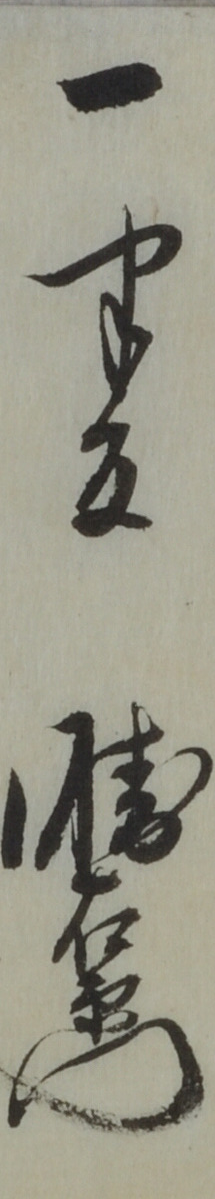一半反勝右衛門
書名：融通割合帳
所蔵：伊那市立高遠町図書館・合同会社AMANE
